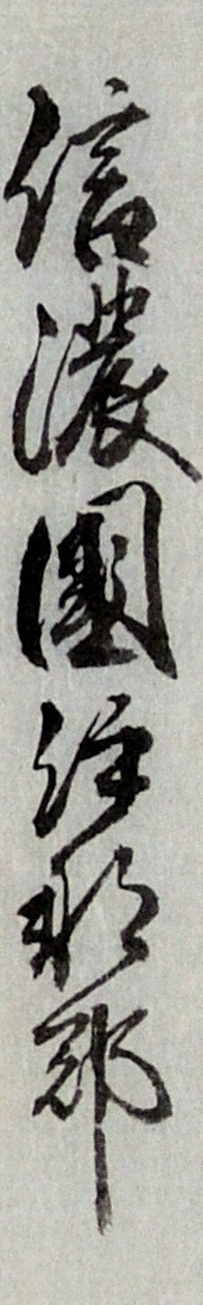信濃国伊那郡
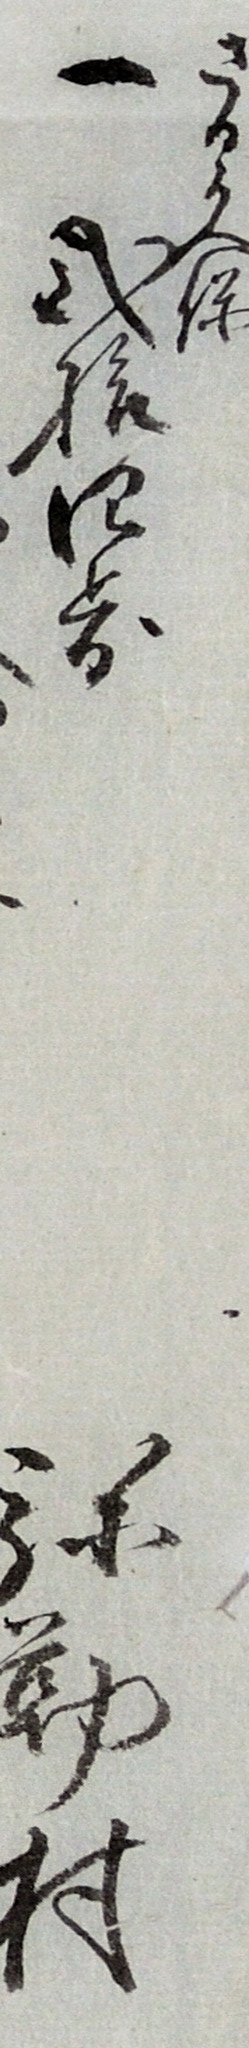一弐拾四歩弥勒村
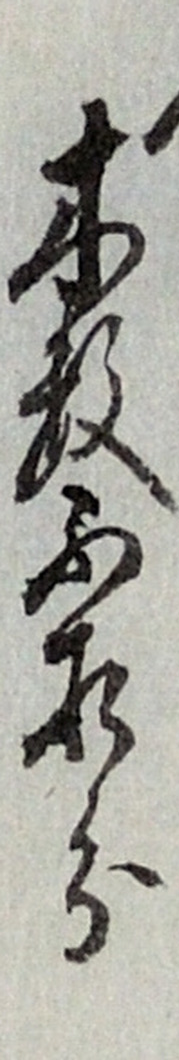木数不相分
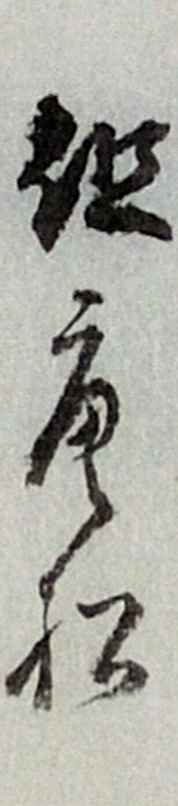但唐松
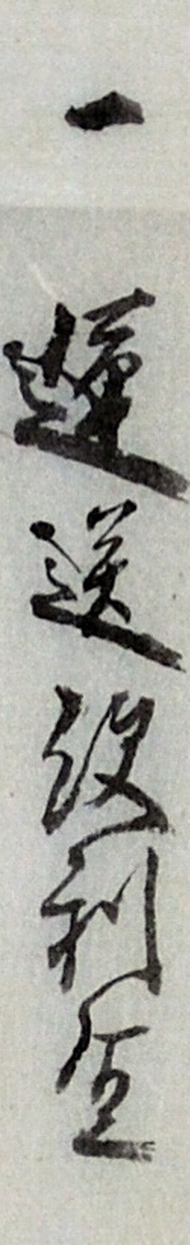一運送便利宜
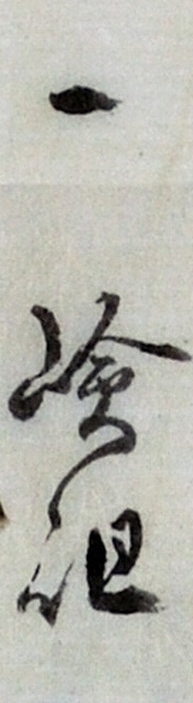一嶮岨
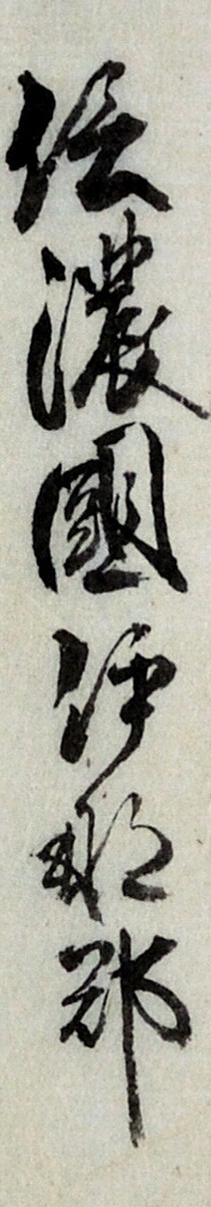信濃国伊那郡
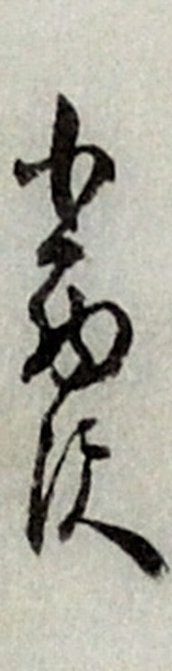小西沢
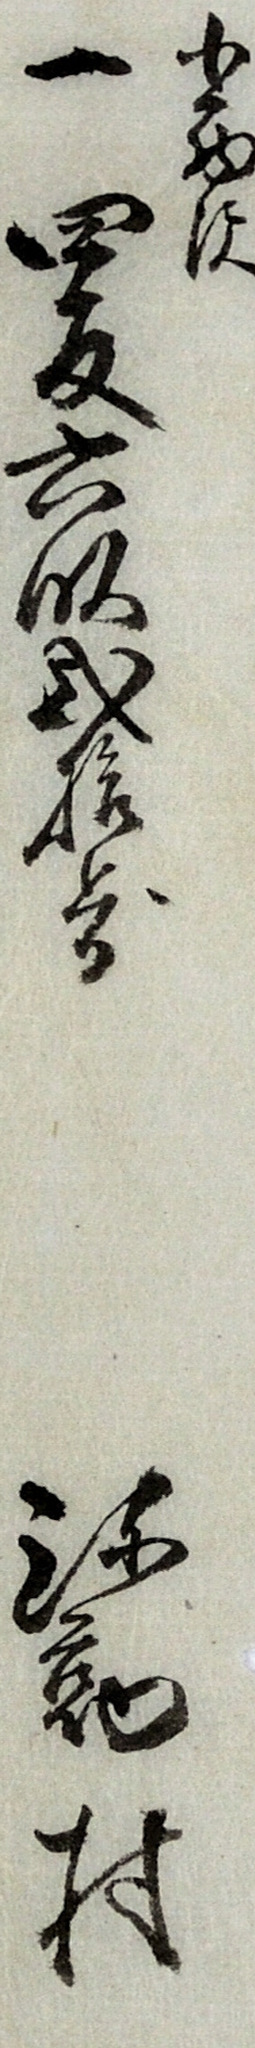一四反六㽗弐拾歩弥勒村
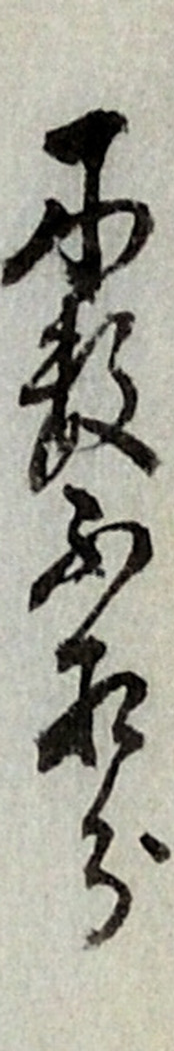木数不相分
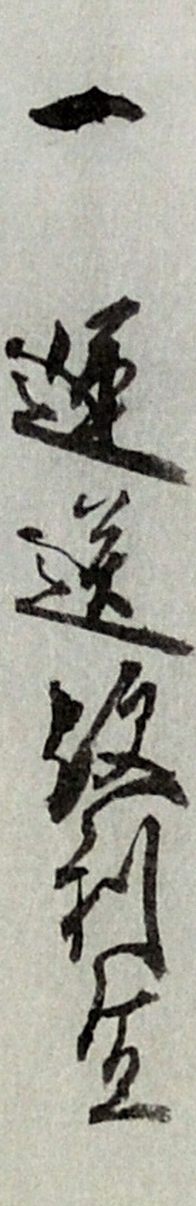一運送便利宜

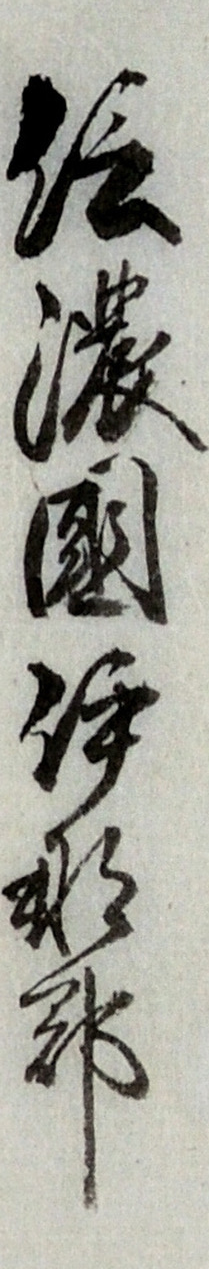信濃国伊那郡
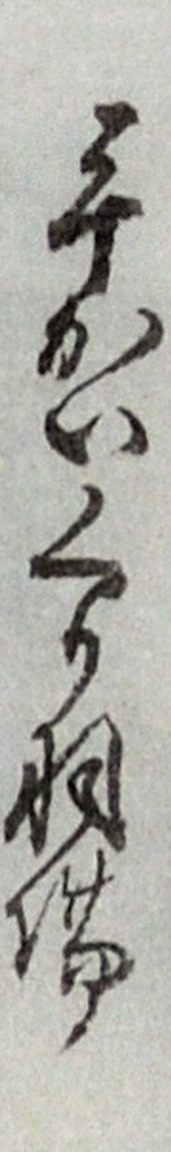平かいくり羽場
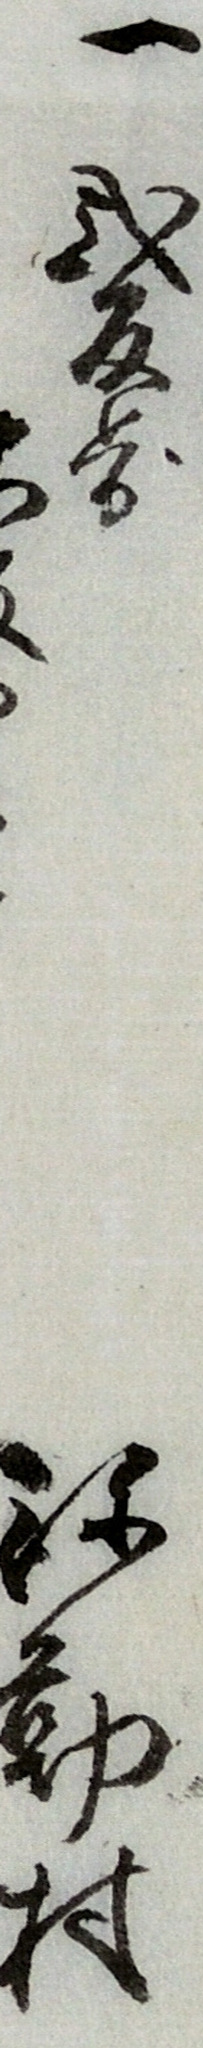一弐反歩弥勒村
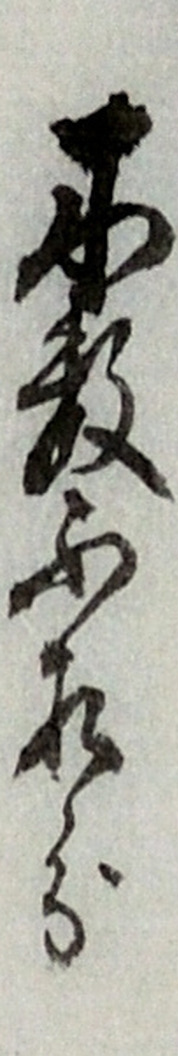木数不相分
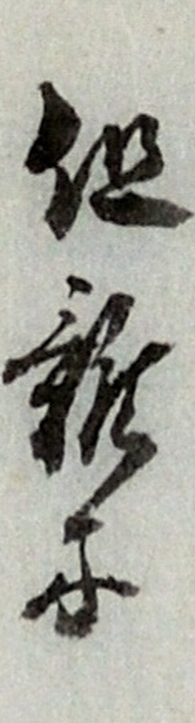但雑木
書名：官林反別帳
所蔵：伊那市立高遠町図書館・合同会社AMANE
